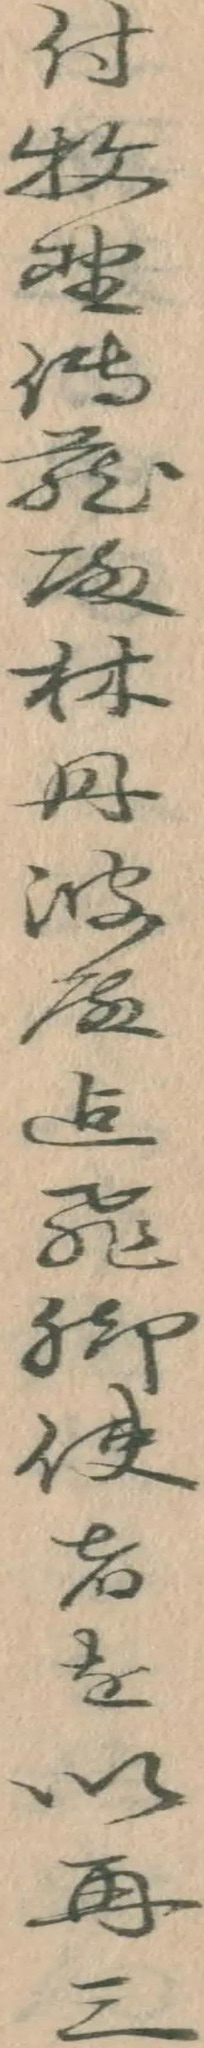付牧野伝蔵殿林丹波殿迄飛脚使者を以再三
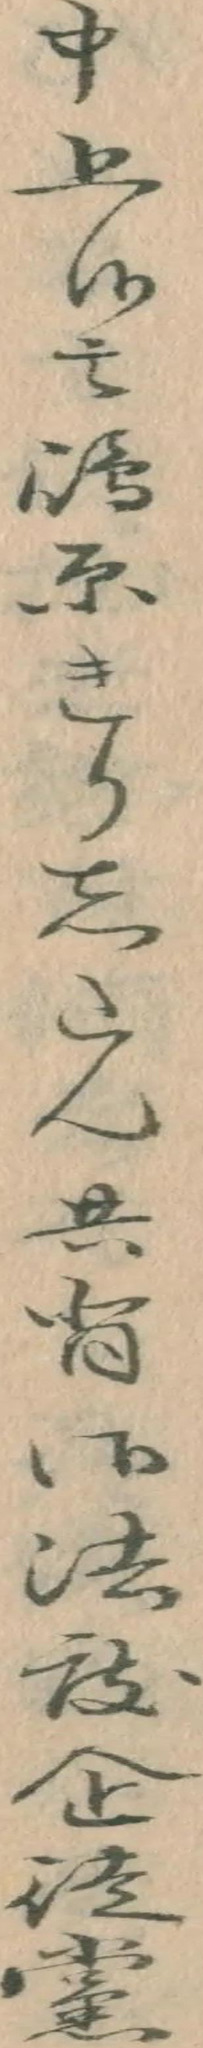申上候其島原きり志たん共背御法度企徒党
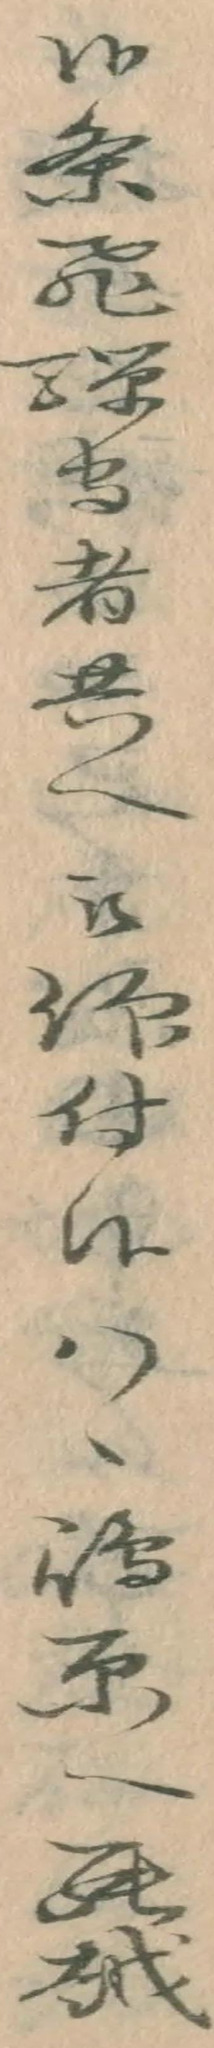候条飛騨守者共へ被仰付候はゝ島原へ罷越

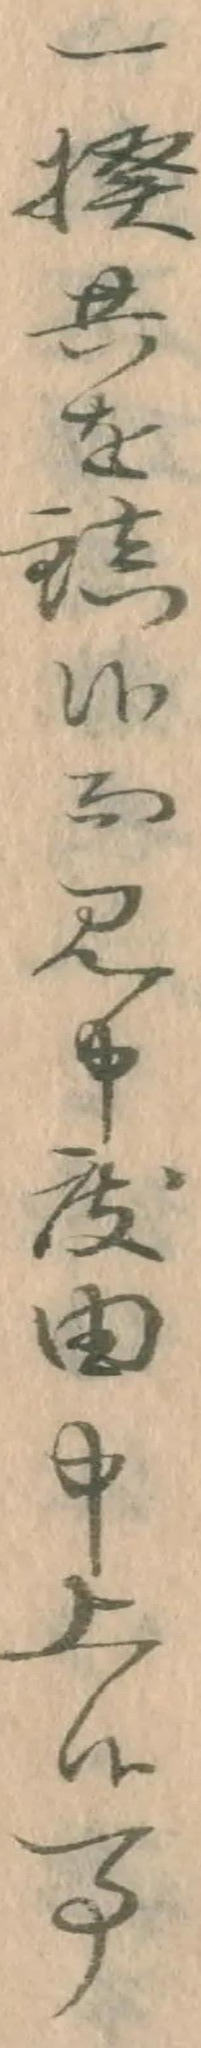一揆共を鎮候而見申度由申上候事
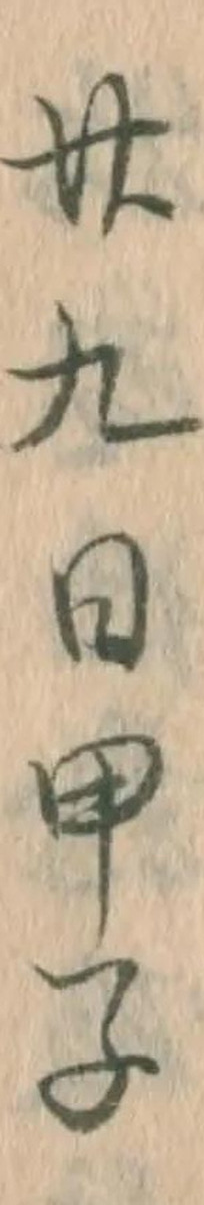廿九日甲子
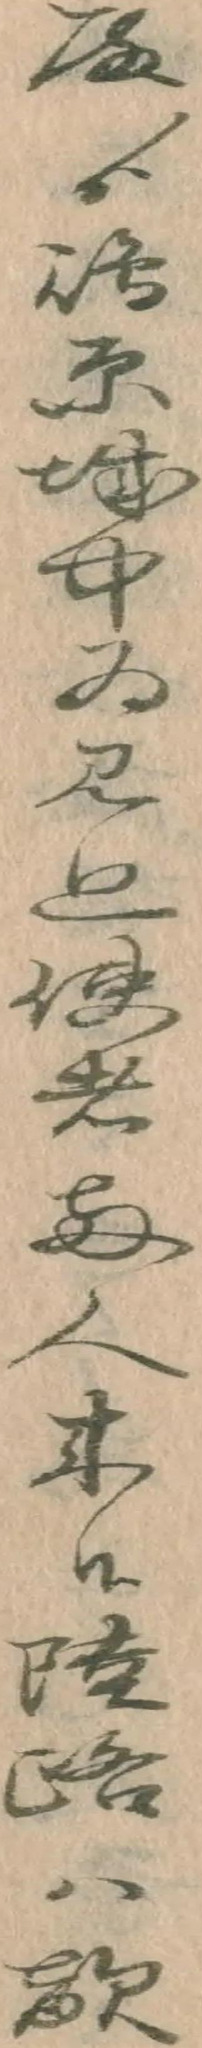殿ゟ島原城中ゐ見廻使者両人来候陸路は敵
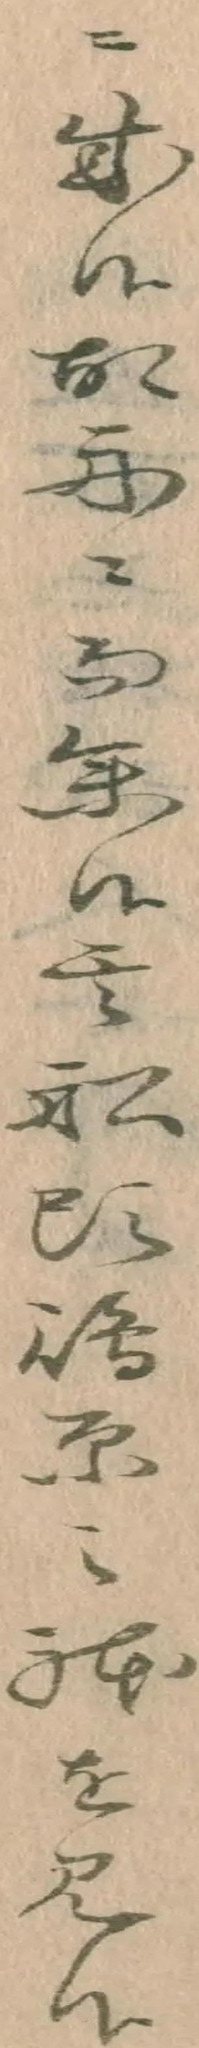に成候故舟に而参候其舩頭島原之躰を見候
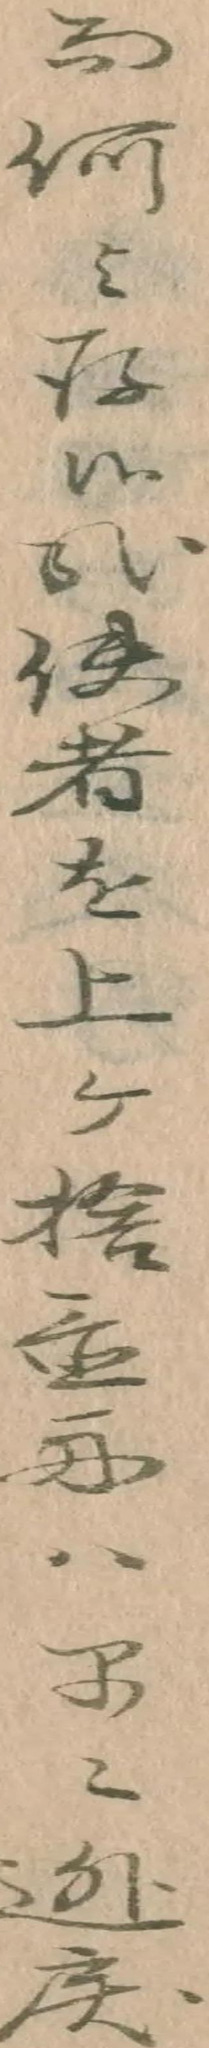而何与存候哉使者を上け捨置舟は早々逃戻
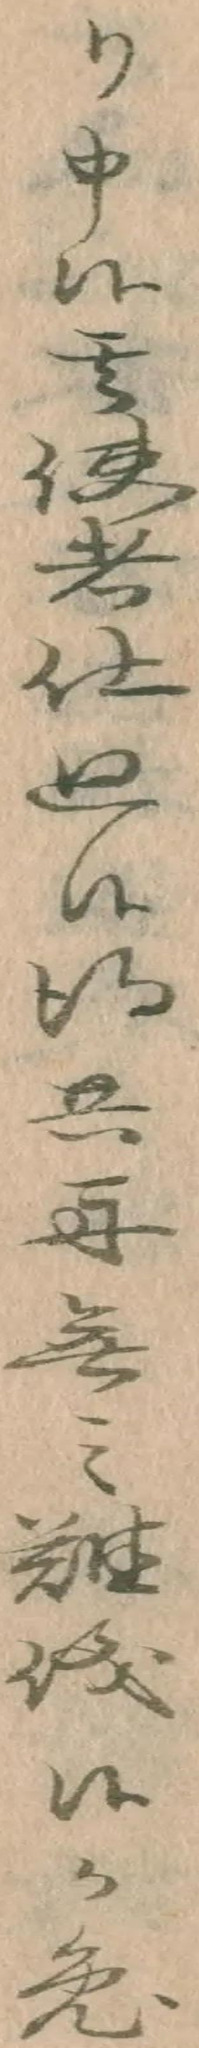り申候其使者仕廻候得共舟無之難儀候か兎
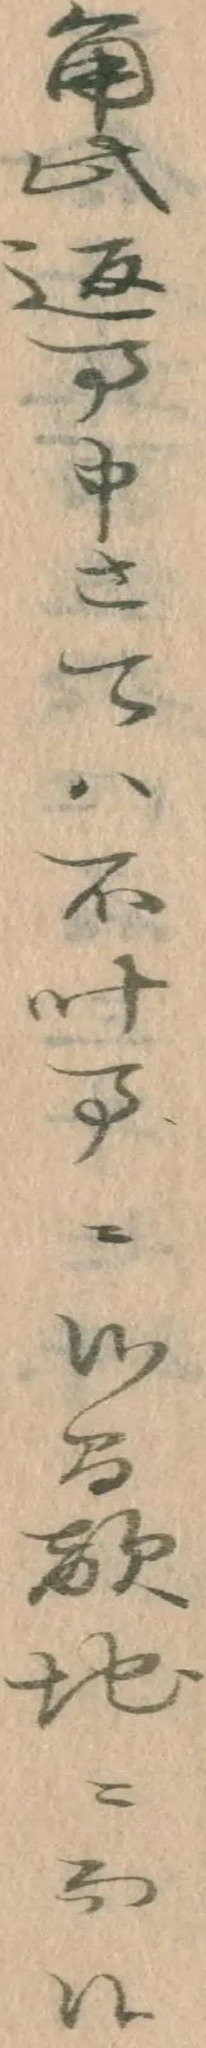角此返事申さては不叶事に候間敵地に而候
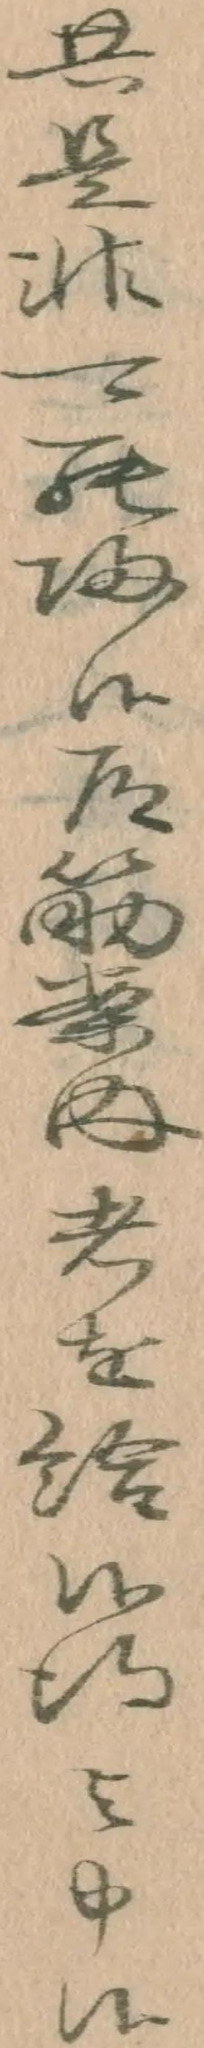共是非可罷帰候道筋案内者を給候得与申候
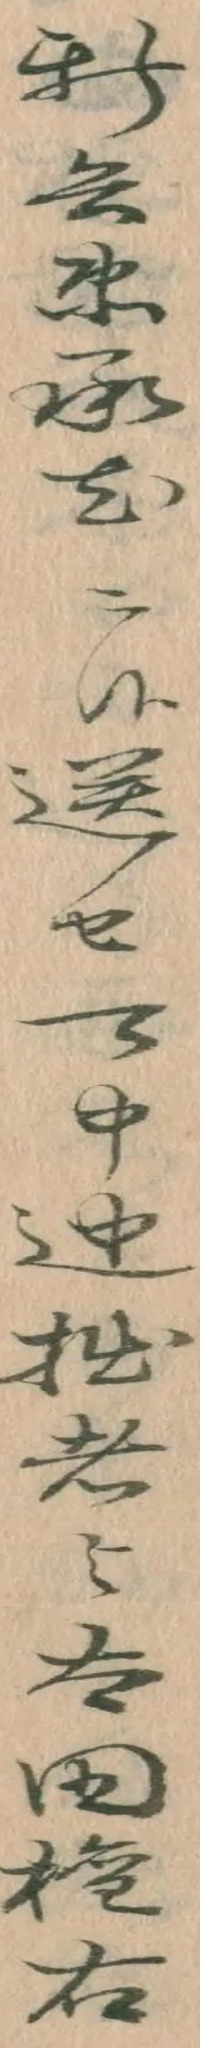新兵衛承尤に候送せ可申迚拙者与太田権右
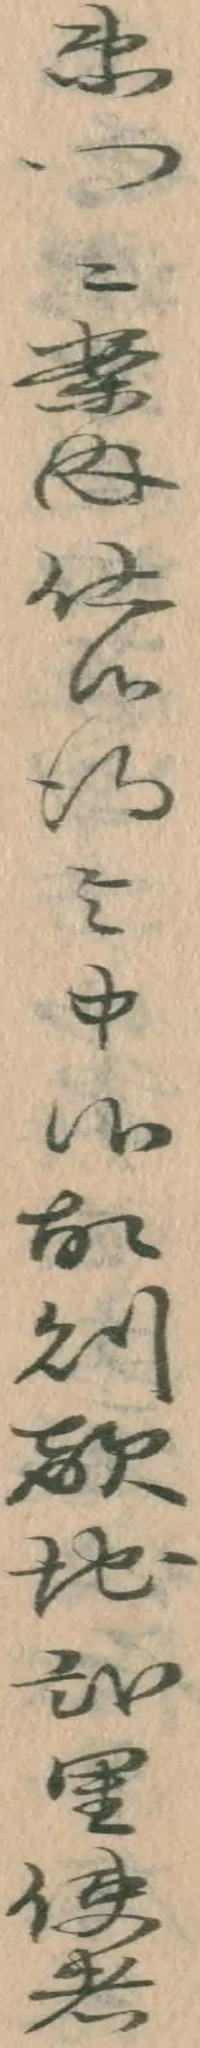衛門に案内仕候得与申候故則敵地弐里使者
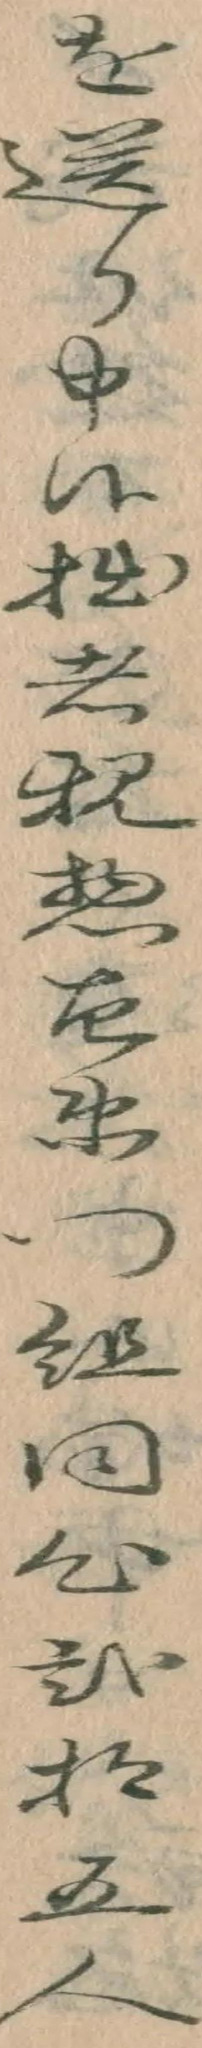を送り申候拙者親惣左衛門組同心弐拾五人
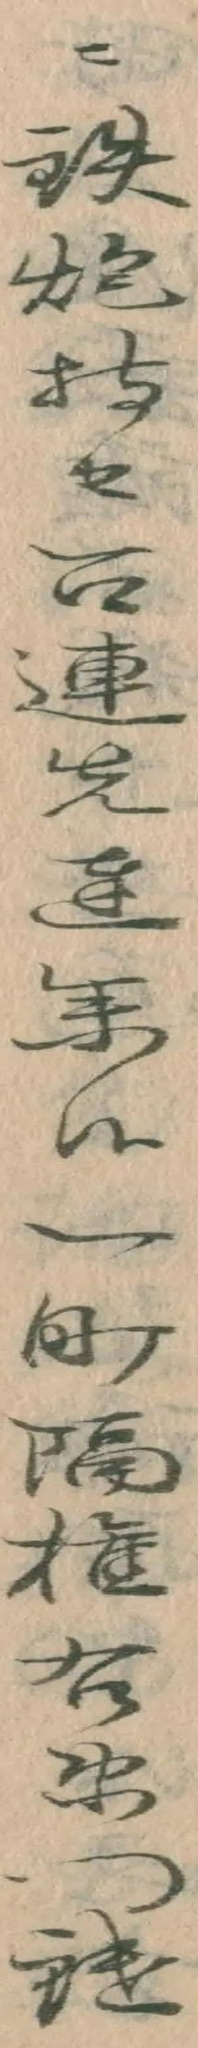に鉄炮持せ召連先達参候一町隔権右衛門鑓
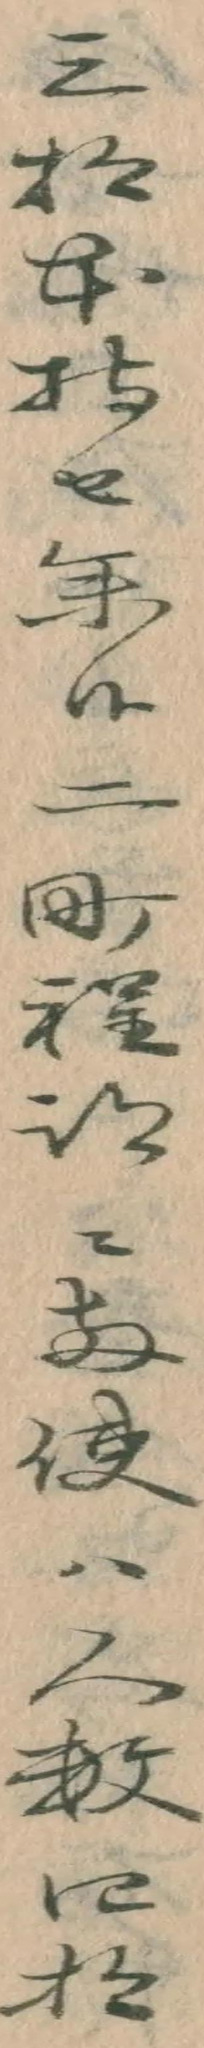三拾本持せ参候二町程跡に両使は人数四拾
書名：切支丹御退治記 49巻. [2]
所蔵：国立国会図書館 National Diet Library, JAPAN
